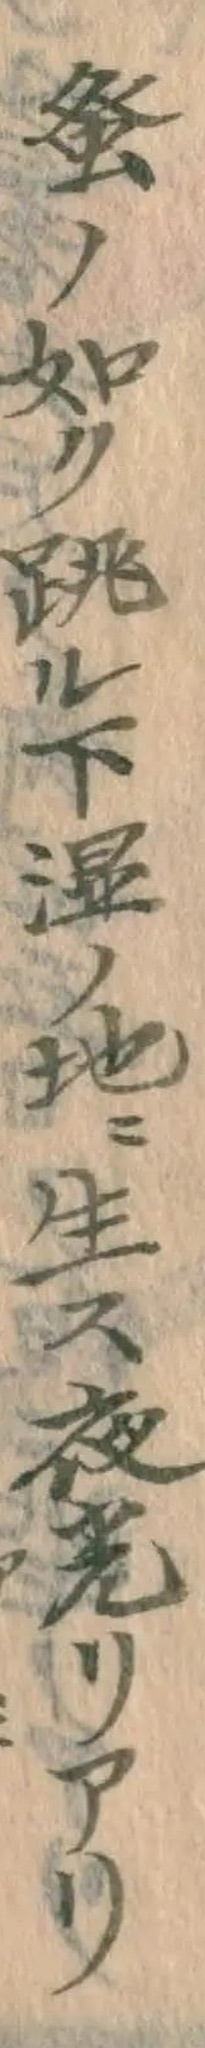蚤ノ如ク跳ル下湿ノ地に生ス夜光リアリ
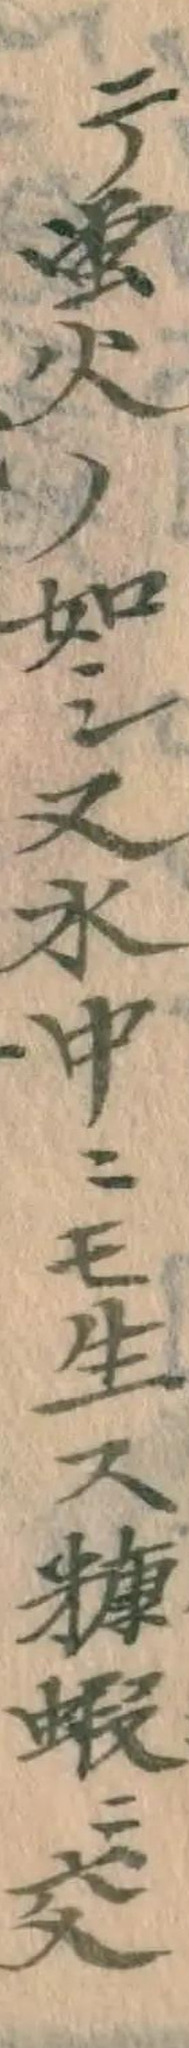テ蛍火ノ如シ又水中ニモ生ス糠蝦ニ交
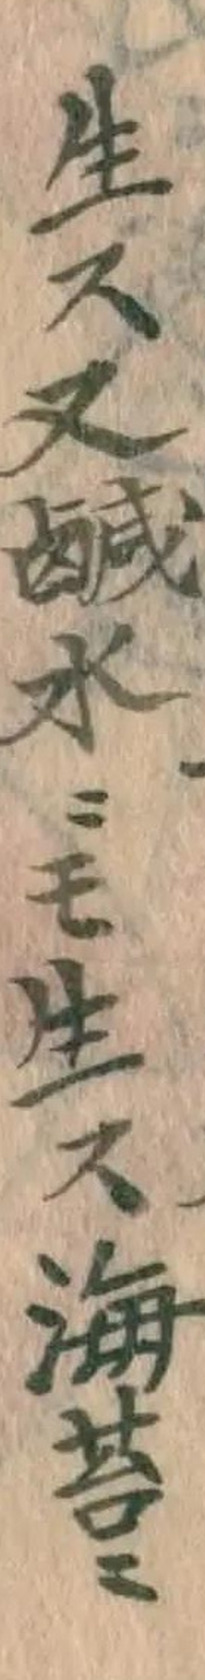生ス又鹹水ニモ生ス海苔ニ
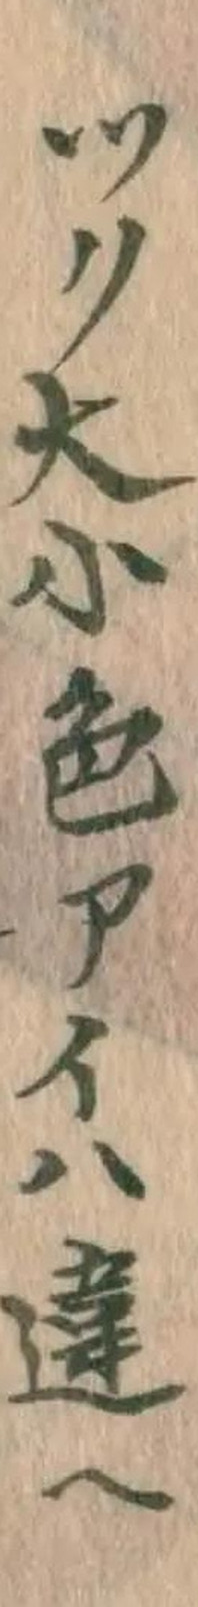ツク大小色アイハ違へ
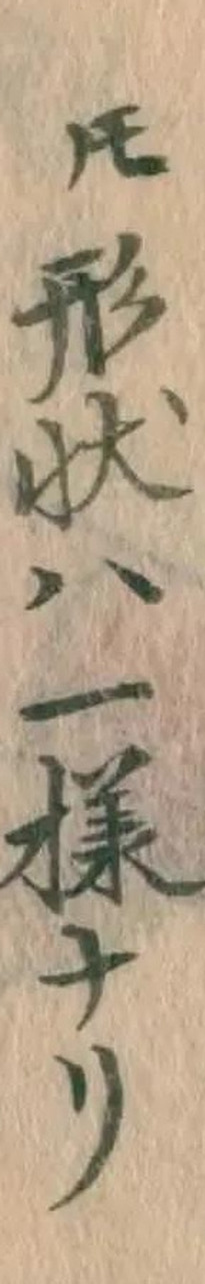トモ形状ハ一様ナリ
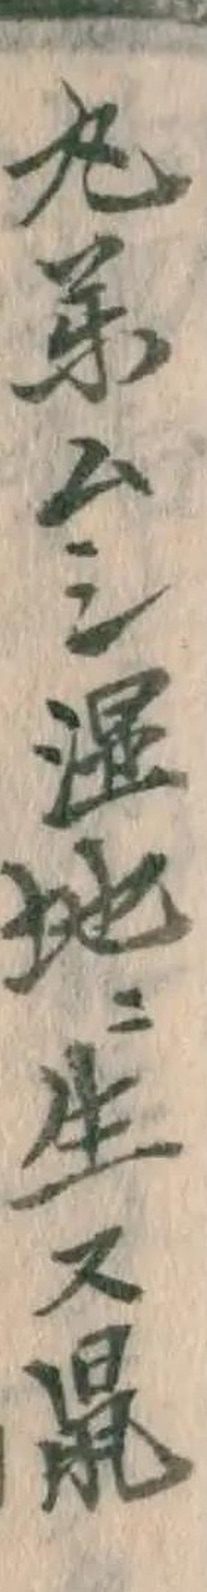丸薬ムシ湿地ニ生ス鼠
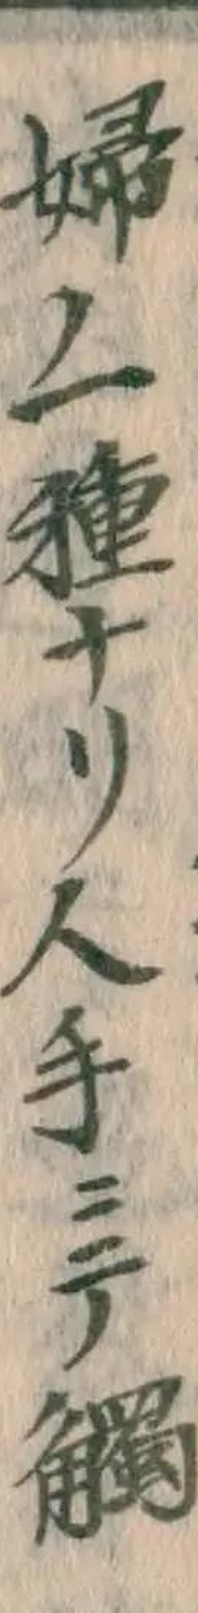婦ノ一種ナリ人手ニテ触
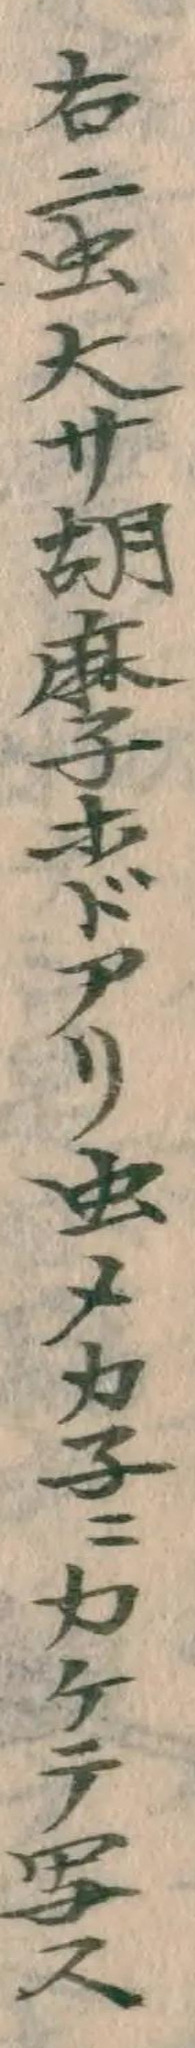右二虫大サ胡麻子ホドアリ虫メカネニカケテ写ス
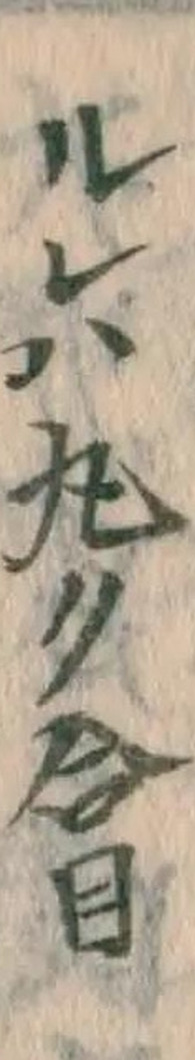ルレハ丸ク合目
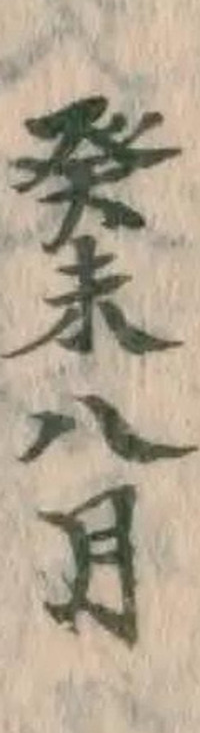癸未八月
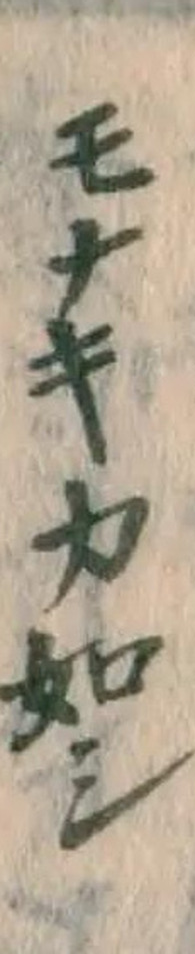モナキカ如シ
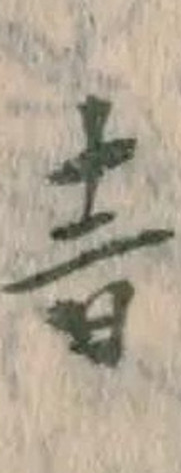十二日
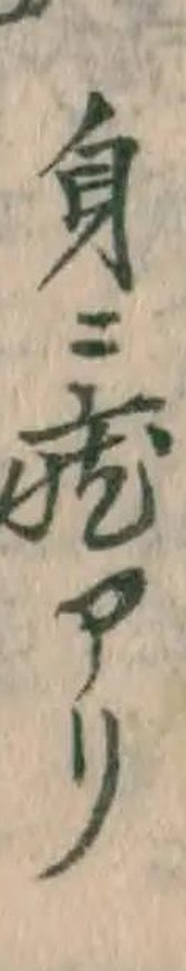身ニ疣アリ
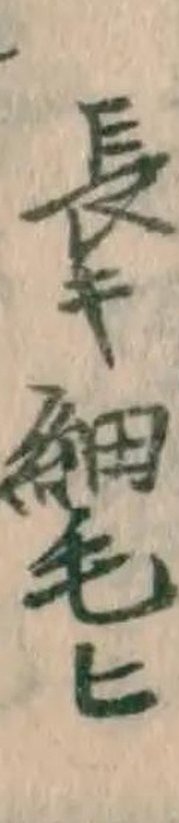長キ細毛ヒ
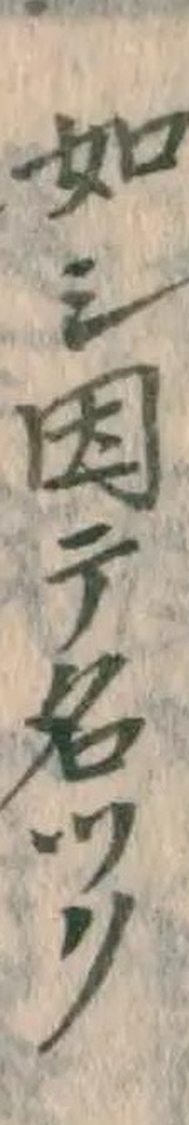如シ因テ名ツク
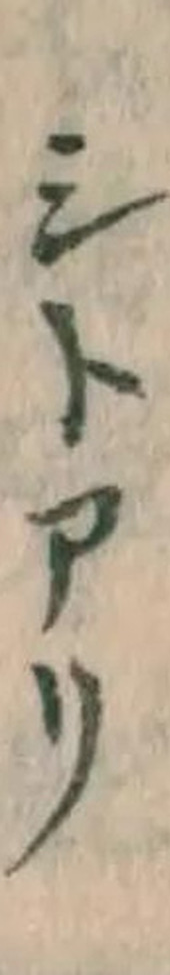シトアリ
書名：千蟲譜 3巻. [3]
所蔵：国立国会図書館 National Diet Library, JAPAN
